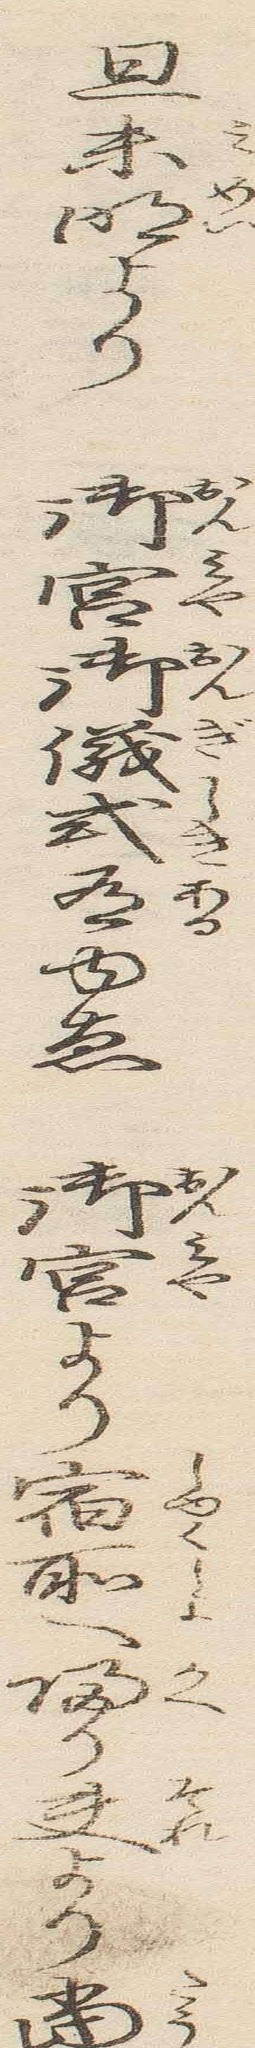旦未明より御宮御儀式有ゆゑ御宮より宿所へ帰り夫より當
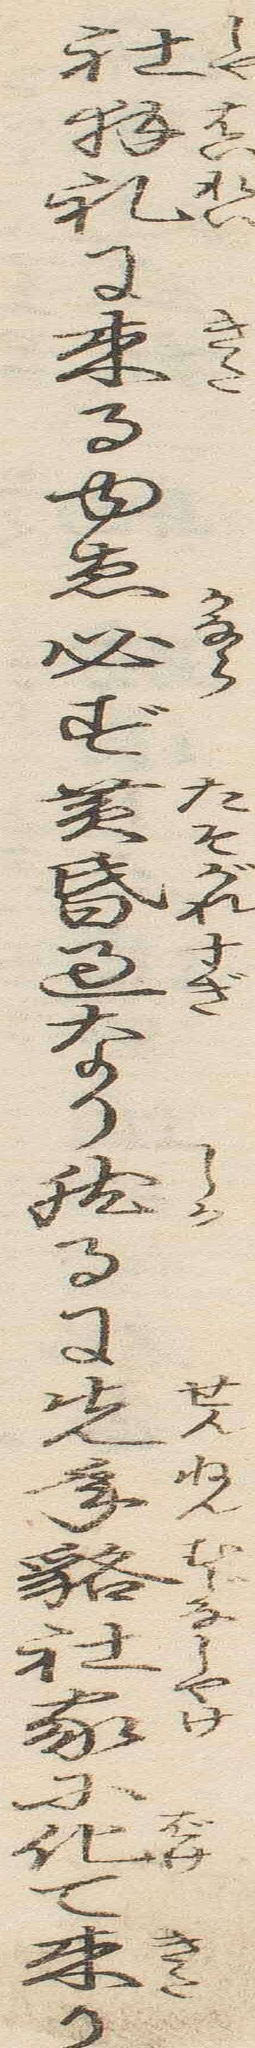社拜礼に來るゆゑ必黄昏過なり然るに先年貉社家に化て來り
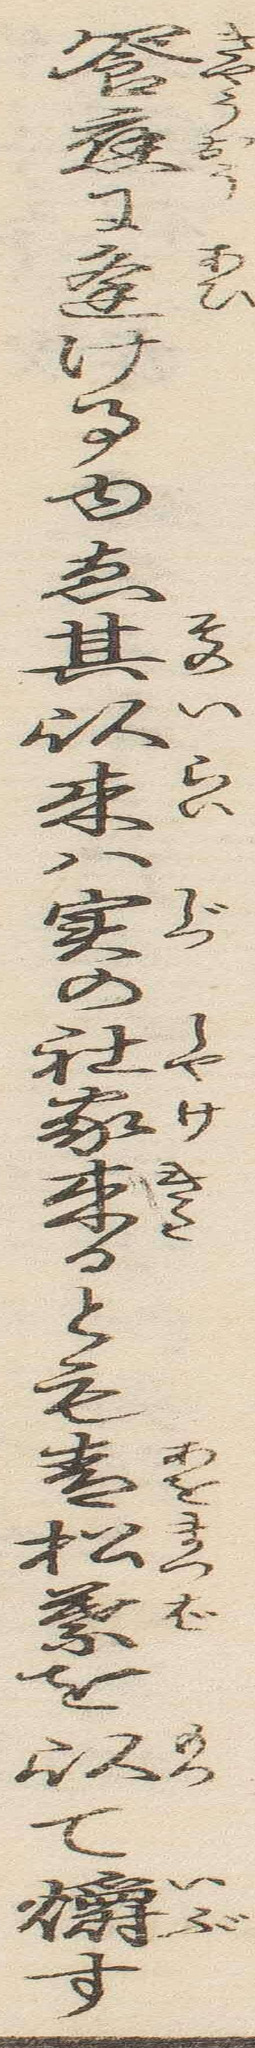饗應に逢けるゆゑ其以來は実の社家來るとも青松葉を以て爝す
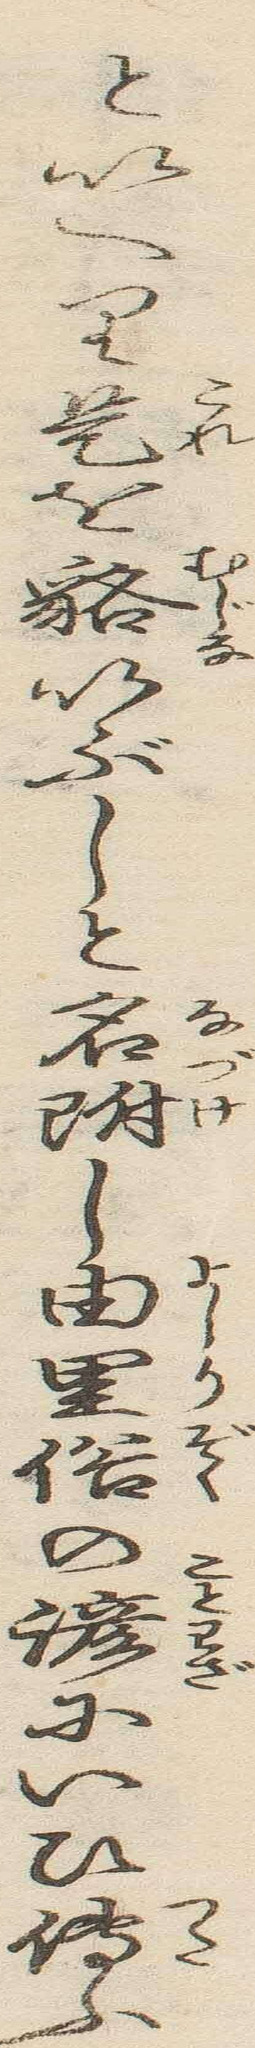といへり是を貉いぶしと名附し由里俗の諺にいひ傳ふ
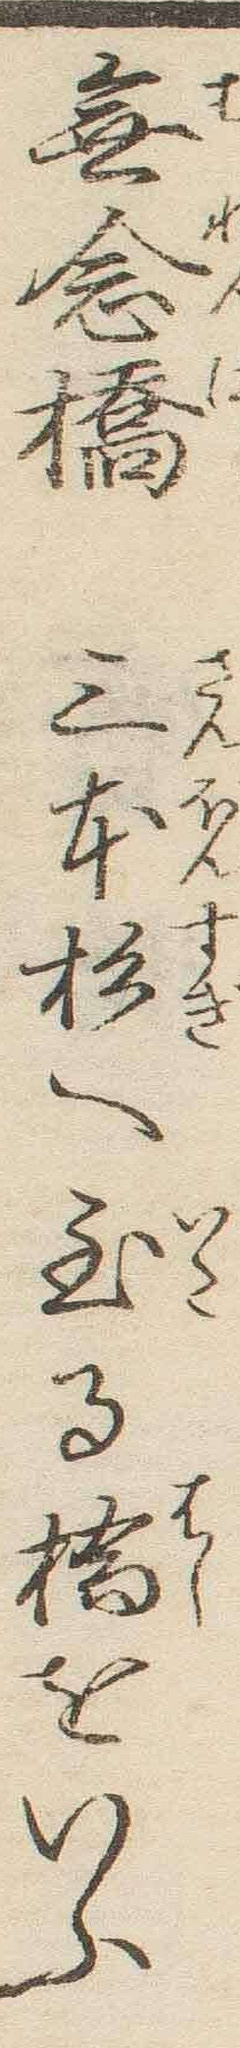無念橋三本杉へ至る橋をいふ
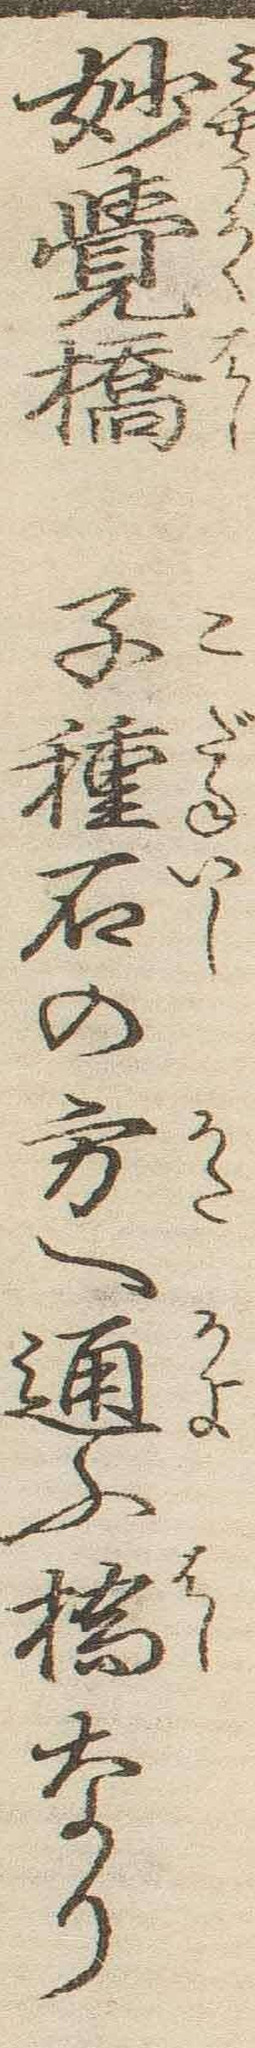妙覺橋子種石の方へ通ふ橋なり
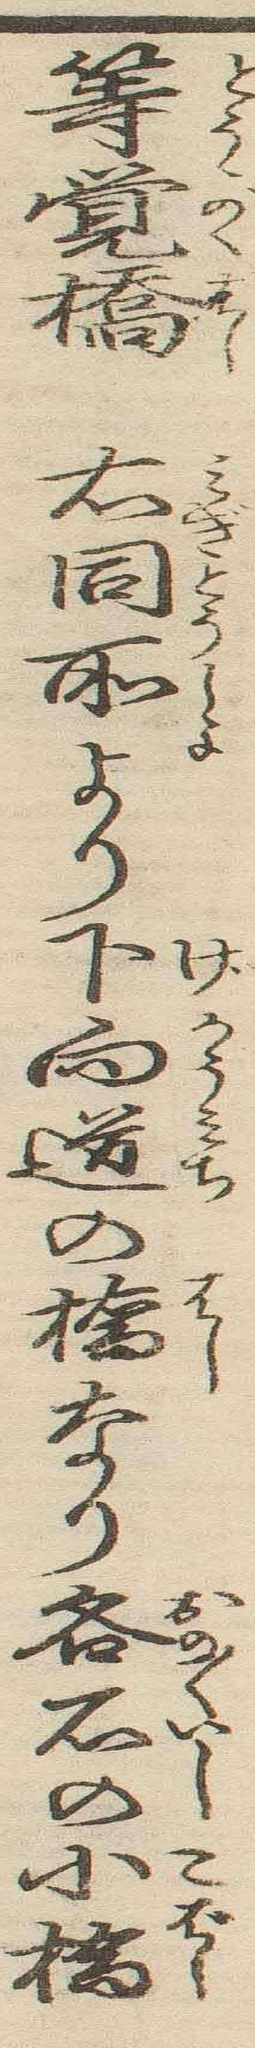等覚橋右同所より下向道の橋なり各石の小橋

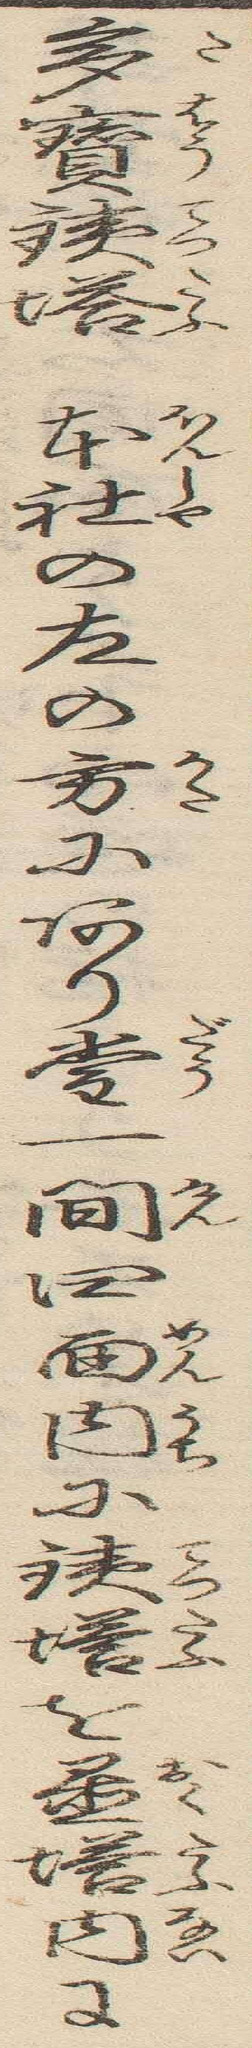多寶銕塔本社の左の方にあり堂一間四面内に銕塔を置塔内に
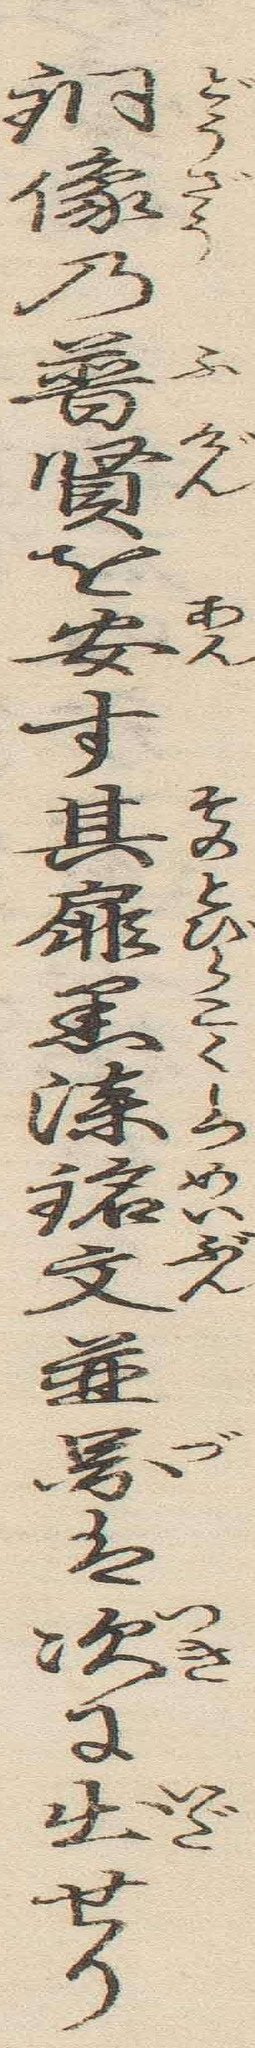銅像の普䝨を安す其扉黒漆銘文並圖は次に出せり
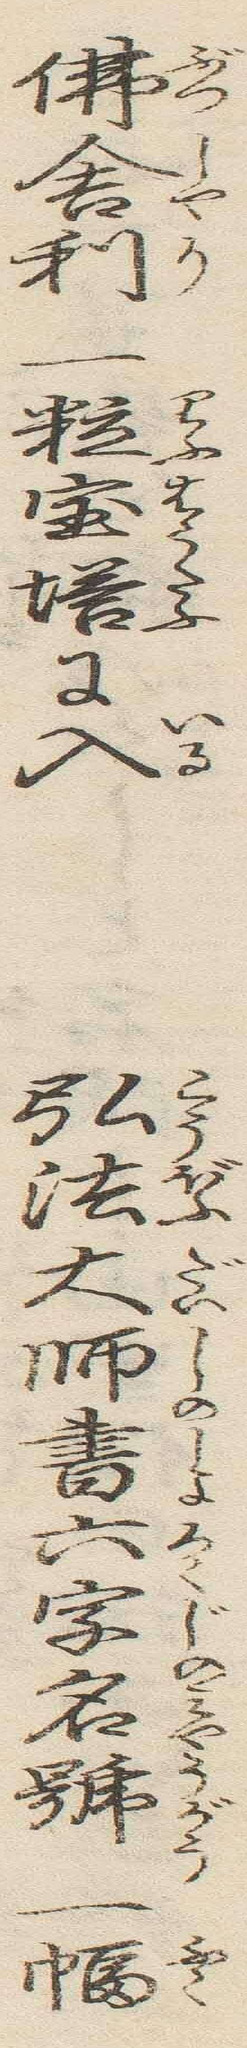佛舎利一粒宝塔に入弘法大師書六字名號一幅
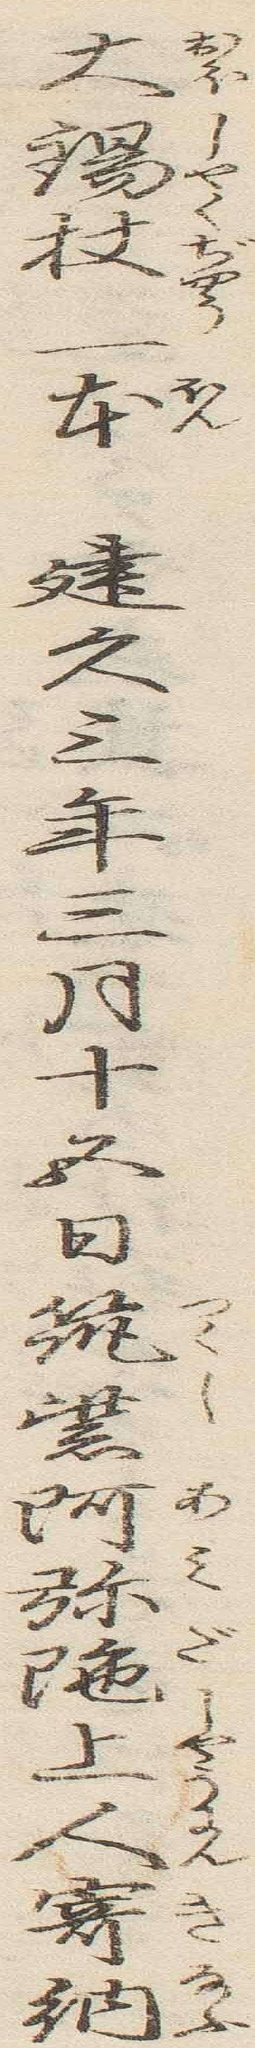大錫杖一本建久三年三月十五日筑紫阿弥陀上人寄納
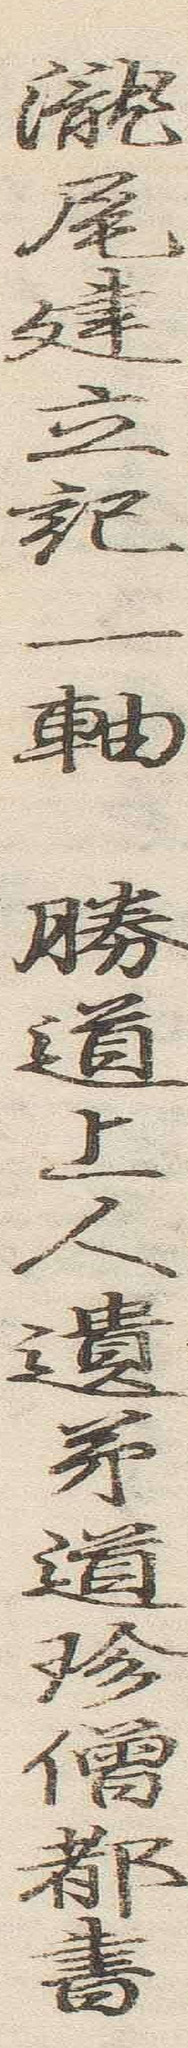瀧尾建立記一軸勝道上人遺弟道珍僧都書
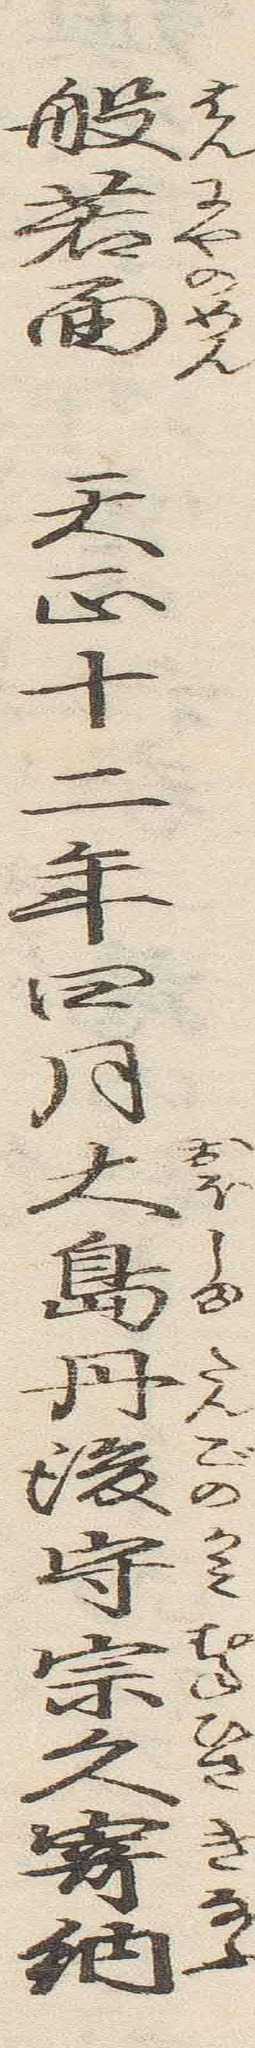般若面天正十二年四月大島丹後守宗久寄納
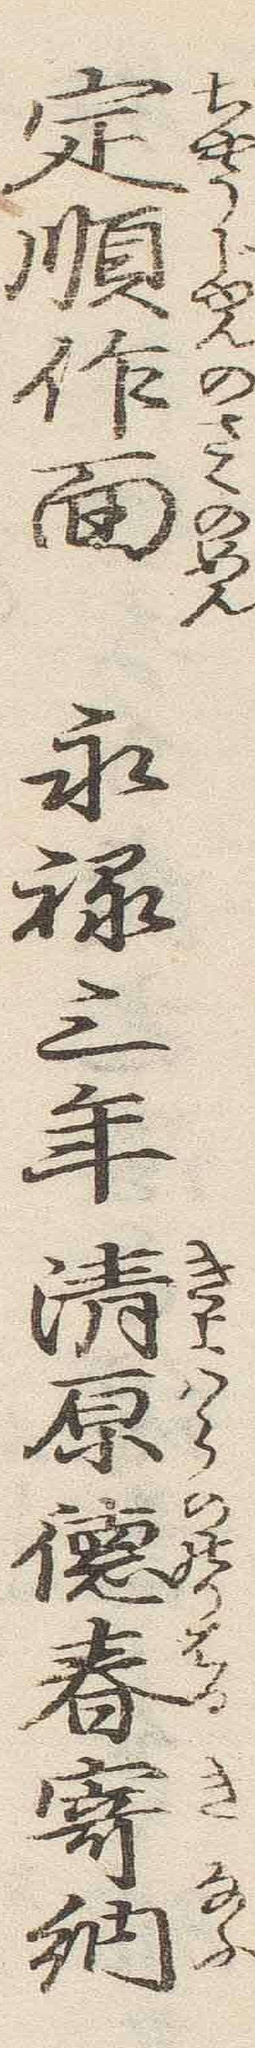定順作面永禄三年清原德春寄納
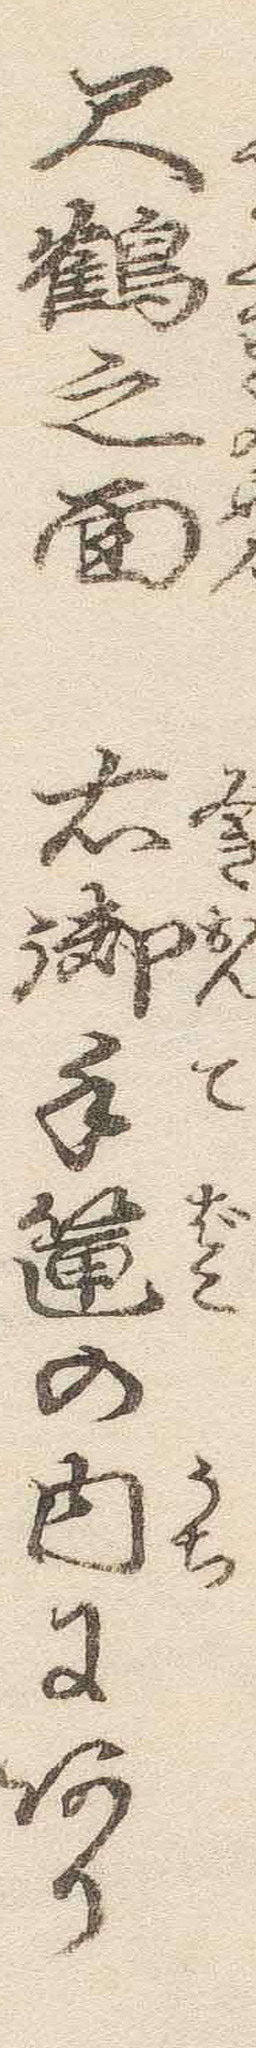尺鶴之面右御手筪の内にあり
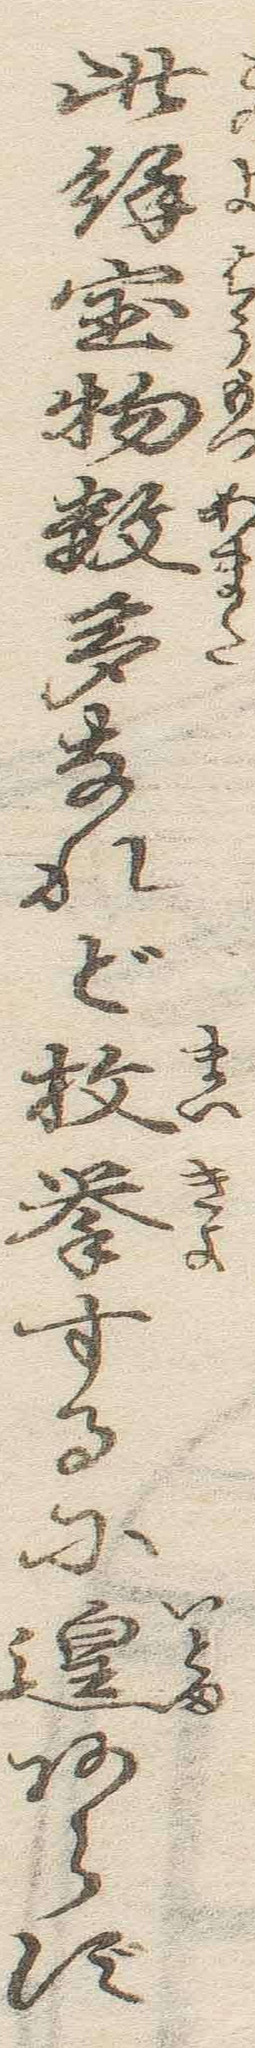此餘宝物数多なれど枚挙するに遑あらず
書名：日光山志
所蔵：東京学芸大学附属図書館 国文学研究資料館
